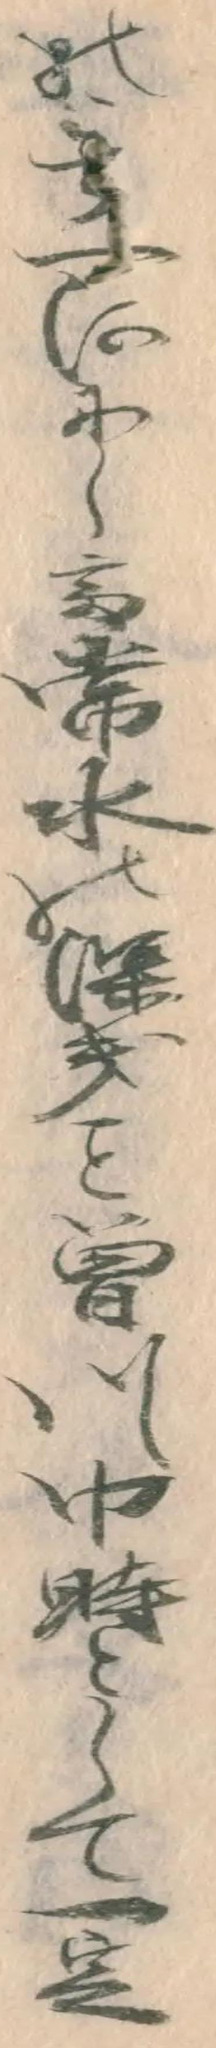の其一河にして常水の深きこと曽川巾時として一定
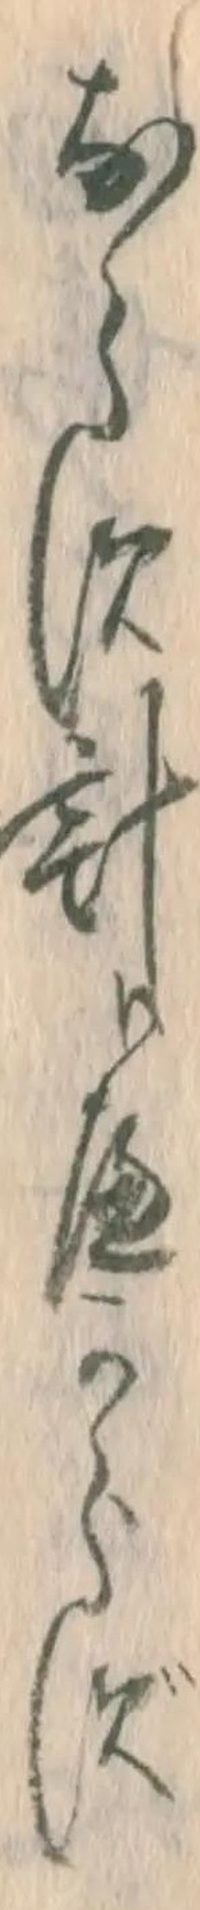ならす計るへからず

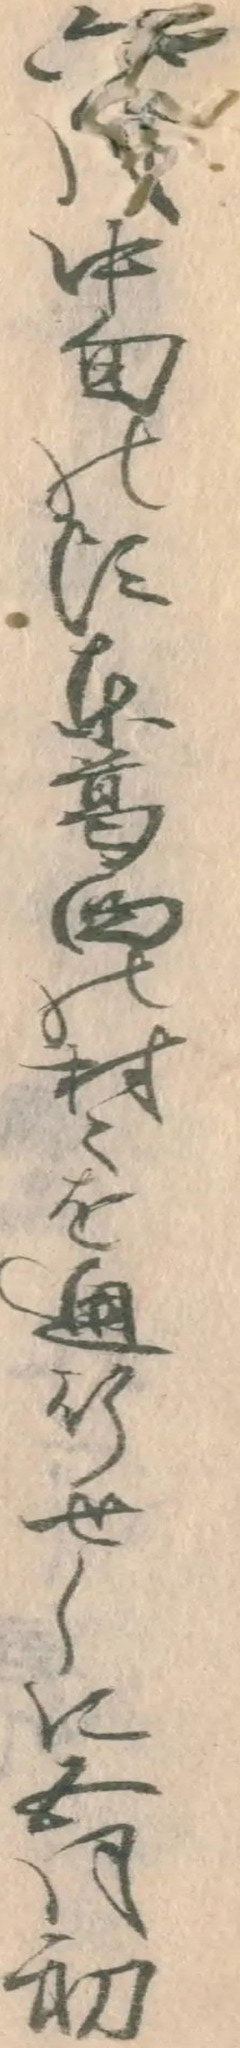六月中旬の頃東葛西の村々を通行せしき五月初
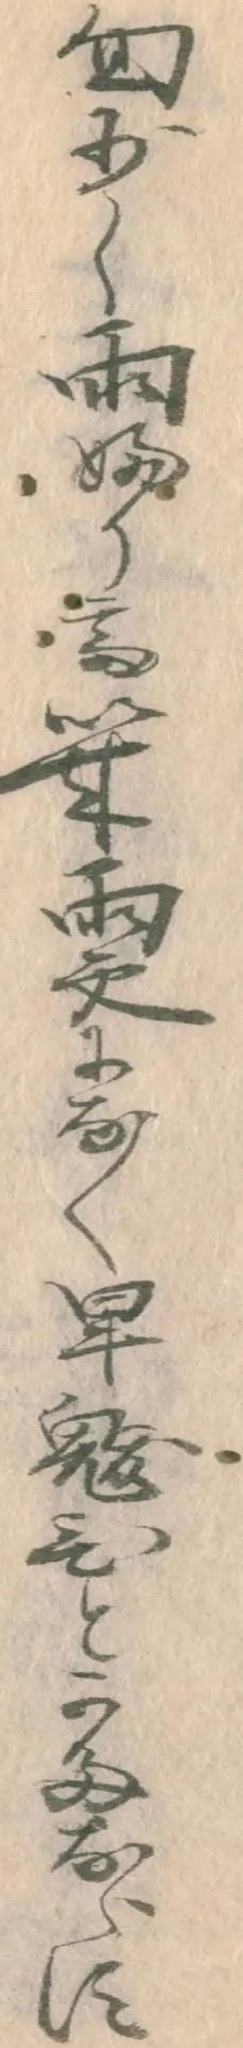旬少し雨ふりて以来雨更になく旱魃ひとかたならす
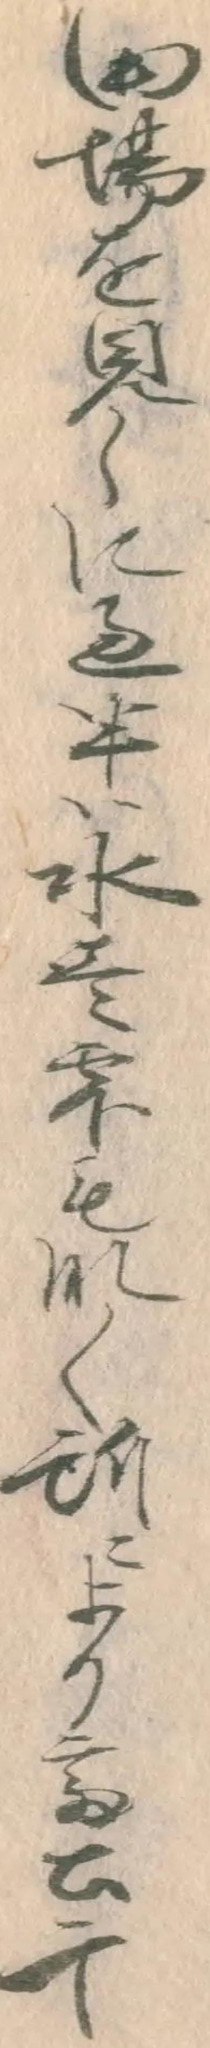田場を見しに過半は水尽雫もなく所によりて土干
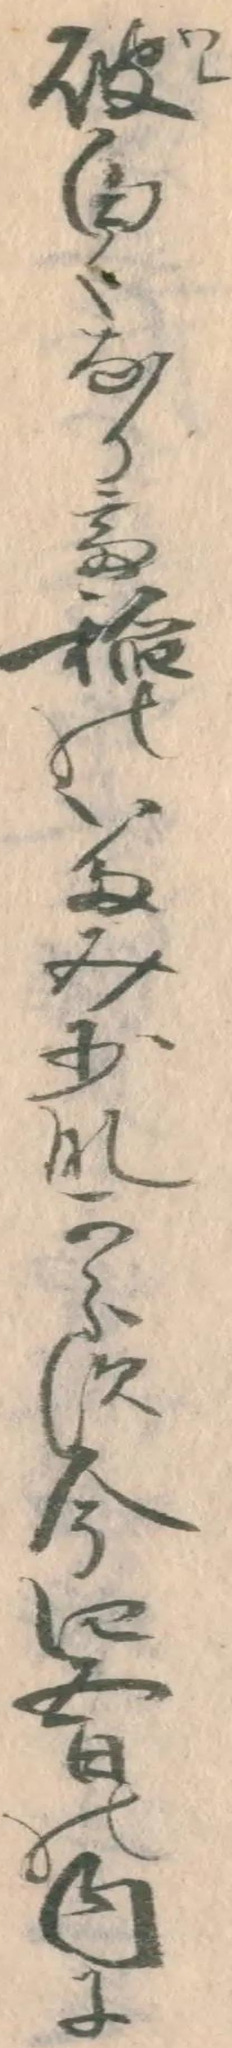破白くなりて稲のいたみ少なからす今四五日の内に
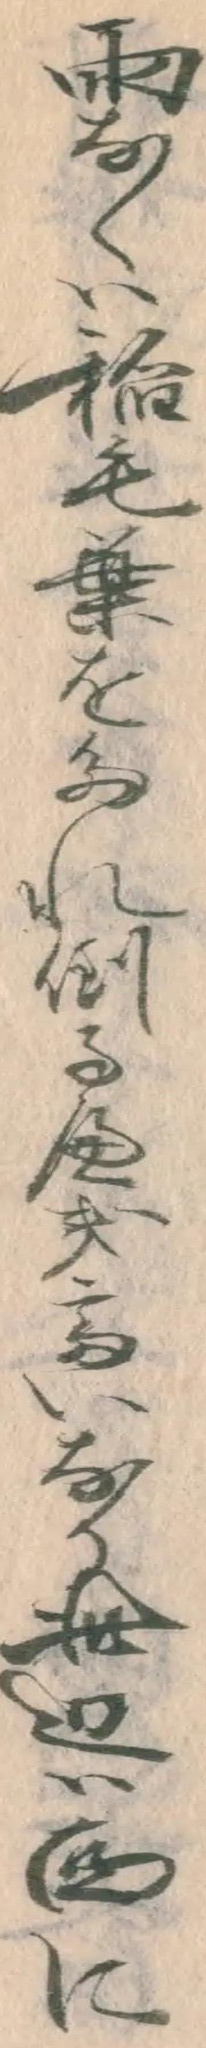雨なくは稲毛葉をたれ倒るへきていなり此辺は西に
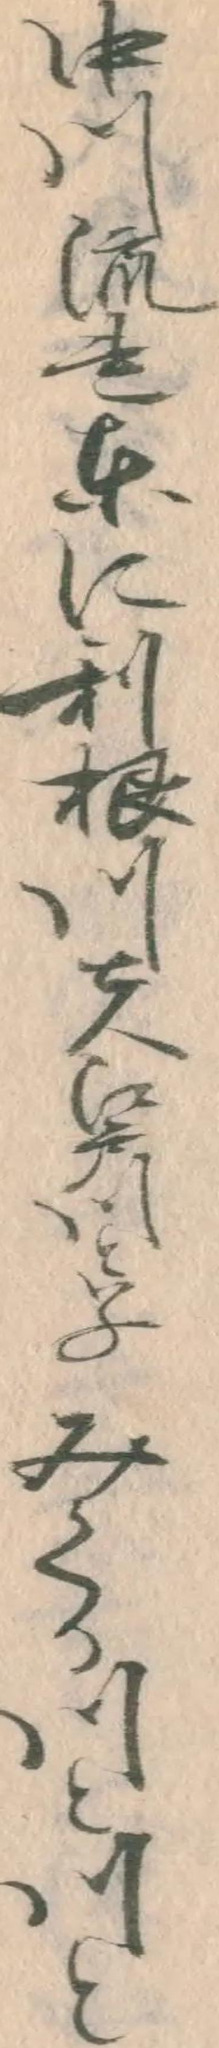中川流れ東に利根川土人江戸川といふみくり川と川と
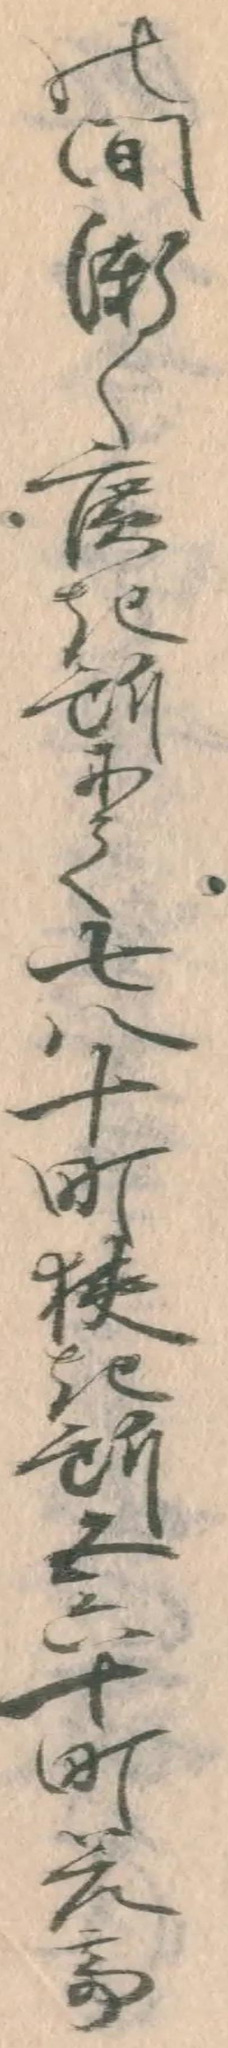の間漸〳〵広き所にて七八十町狭き所五六十町差て
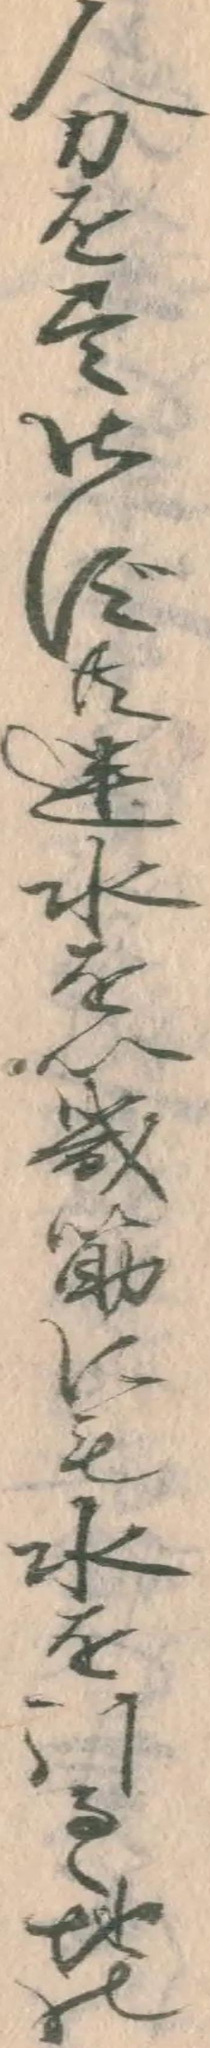人力を尽さず共逆水を以幾筋にも水を引るゝ地の
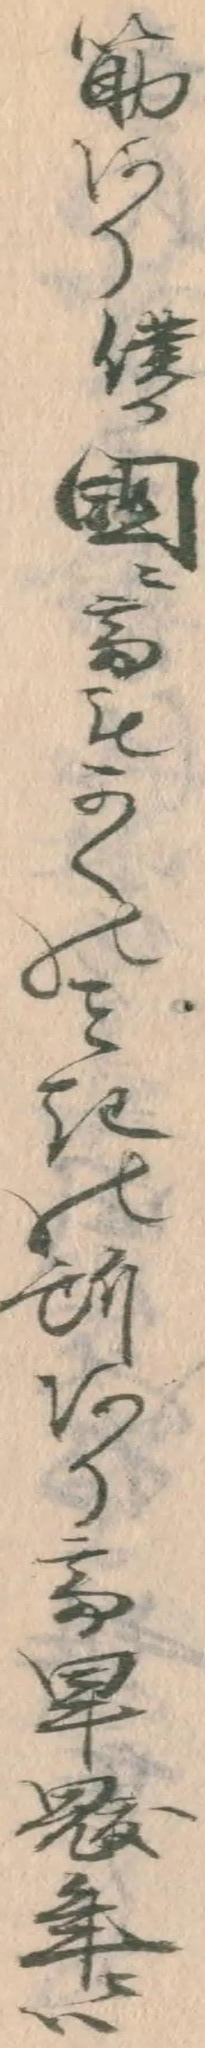筋あり僕か国にてもかくのこときの所ありて旱魃年には
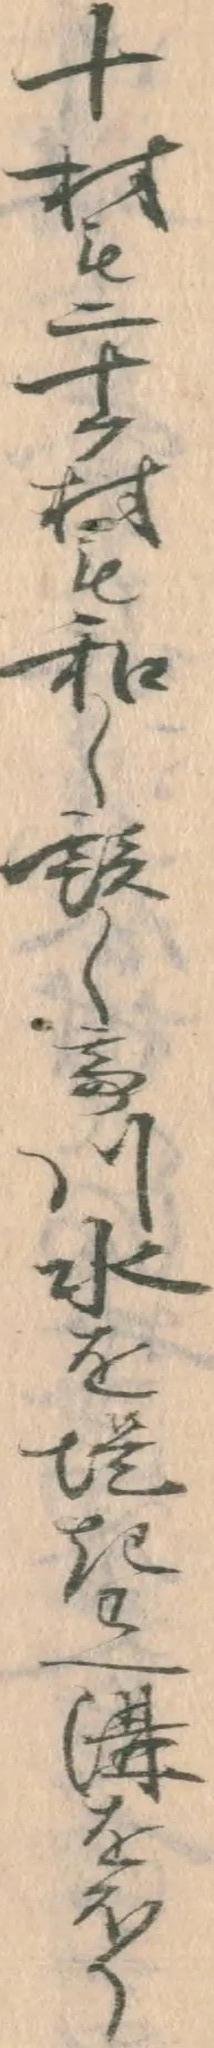十村も二十ケ村も和し談して川水を堤きわへ溝をほり
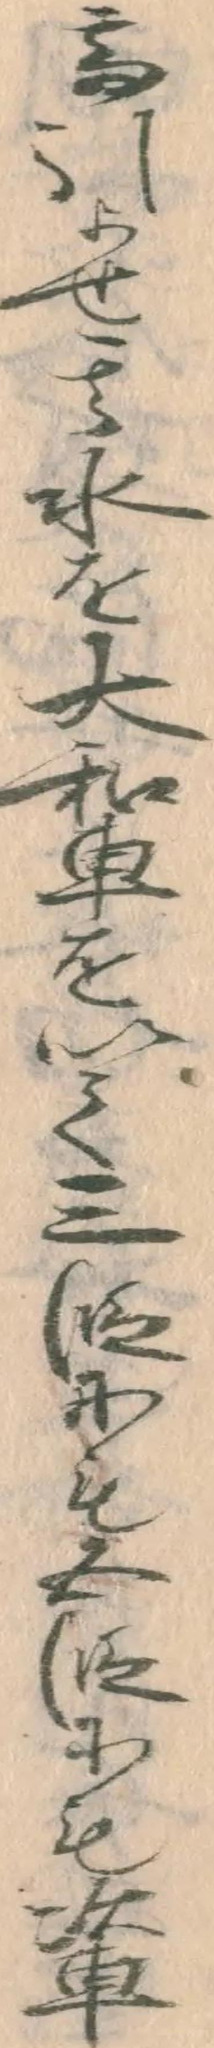高引かせ其水を大和車を以て三段にも五段にも次車
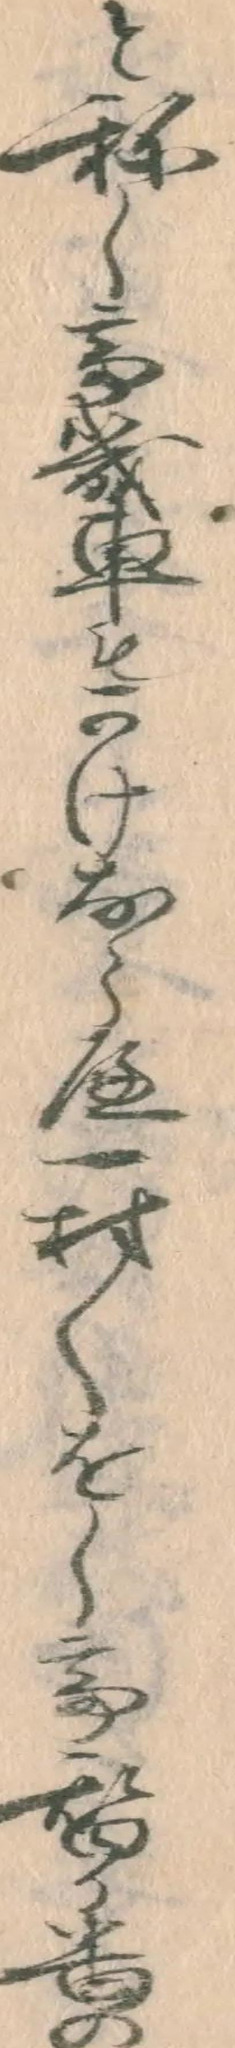と称して幾車もかけならへ一村〳〵をして替り番の
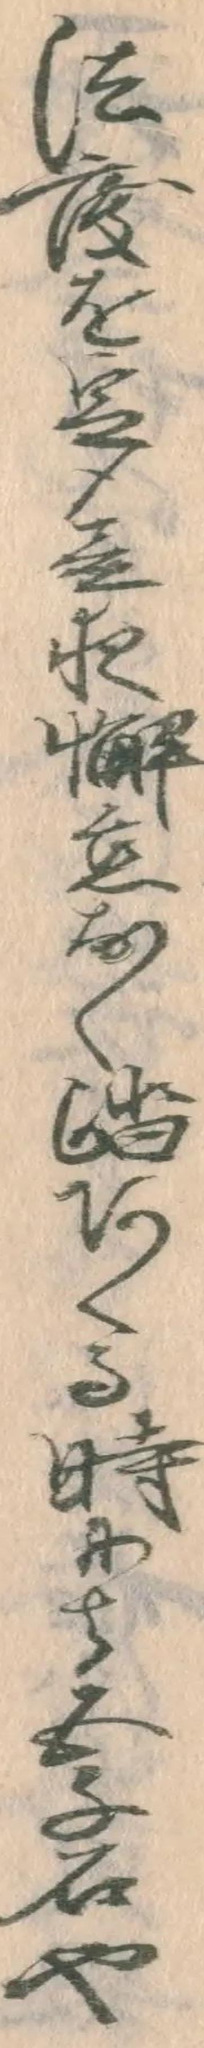法度を定め昼夜懈怠なく踏あくる時には五千石や
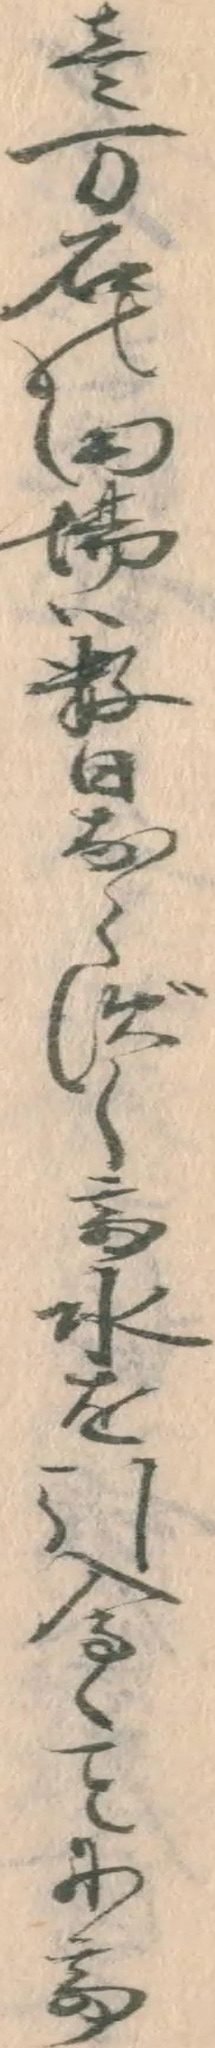壱万石の田場は数日ならずして水を引入るゝことにて
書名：四神地名録 6巻. [4]葛飾郡
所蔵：国立国会図書館 National Diet Library, JAPAN
